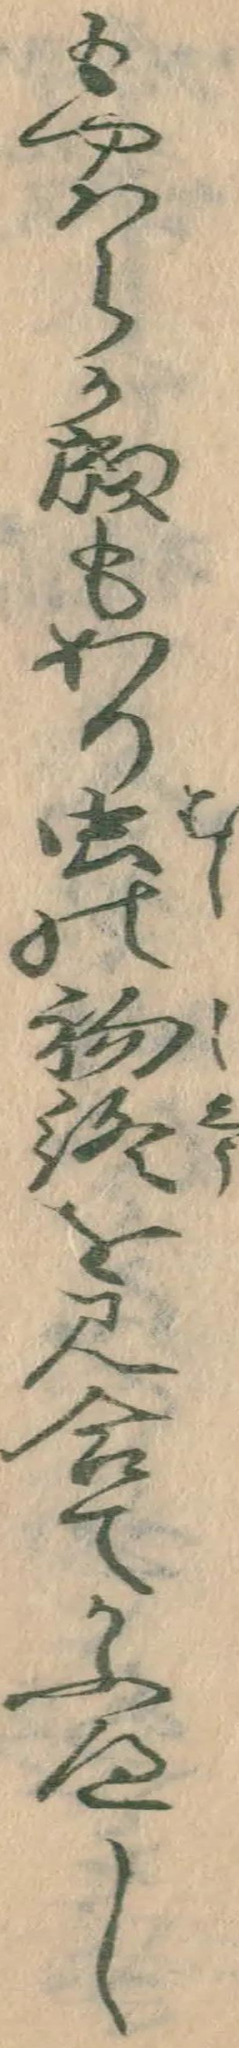もやはらか成もあり虫の初終を見合てかふへし
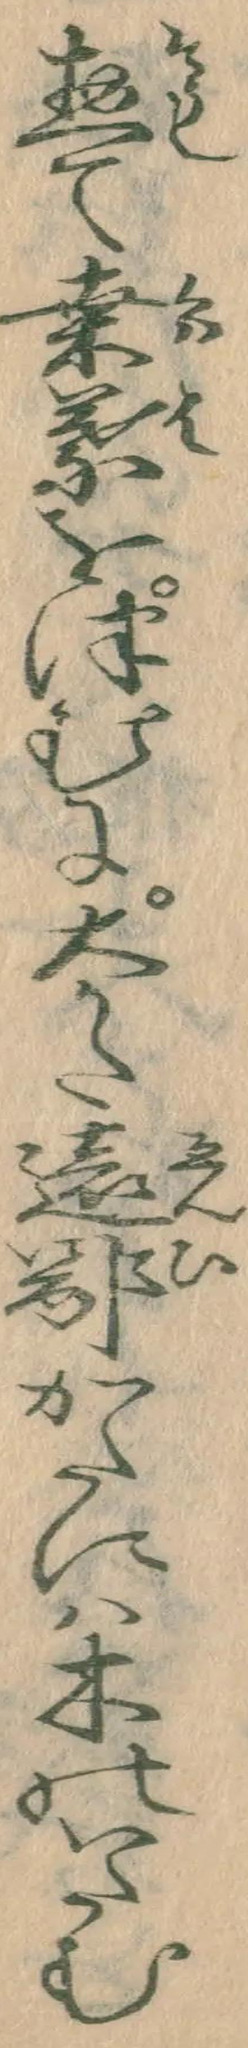惣て桑葉を。つむに。大かた遠鄙かたには木のいたむ
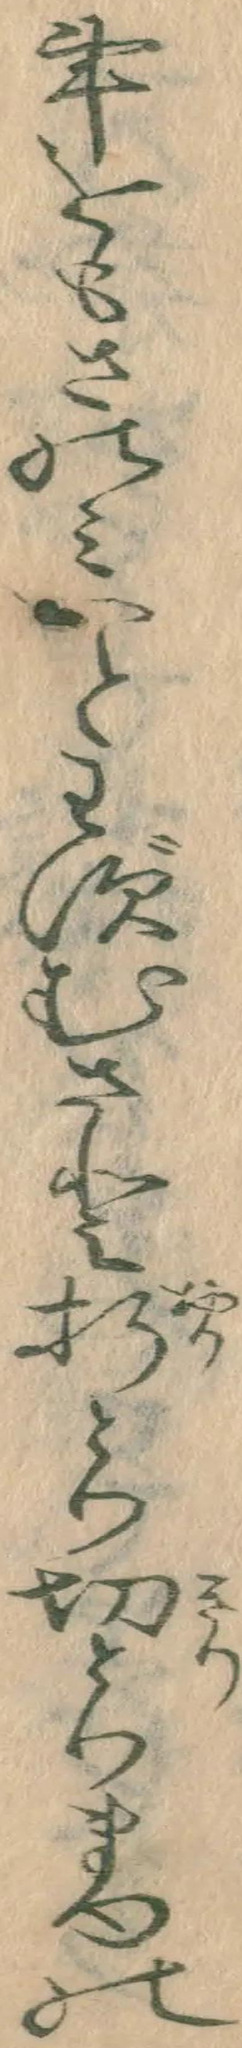事をもさのみいとわずむさと折とり切とりまゆの
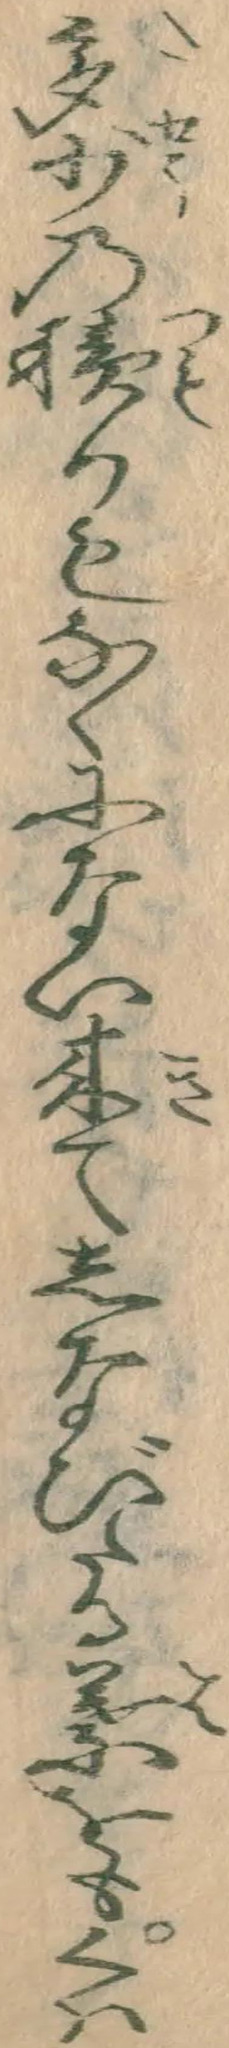多少の積りもなくにない来てしなびたる葉をも。くは
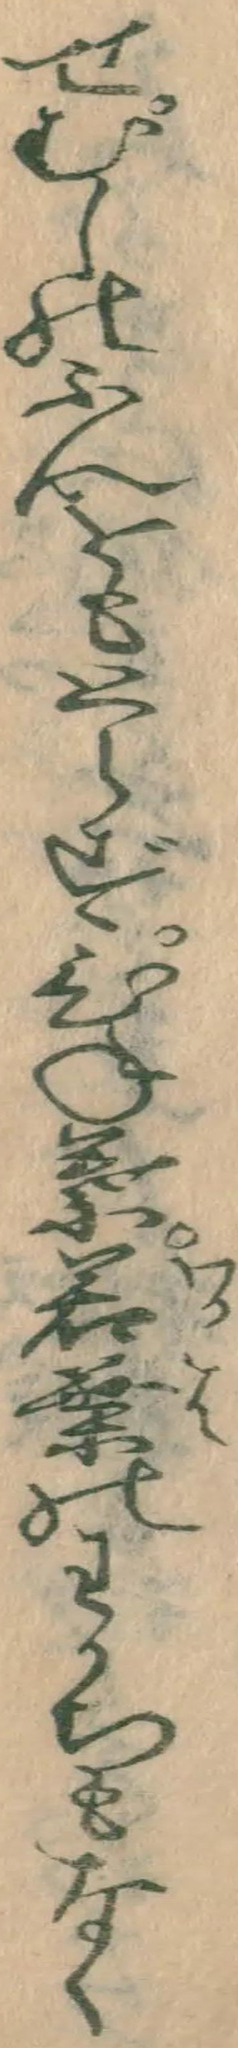せ。むしのふんをもとらず。ひね葉。若葉のわかちもなく

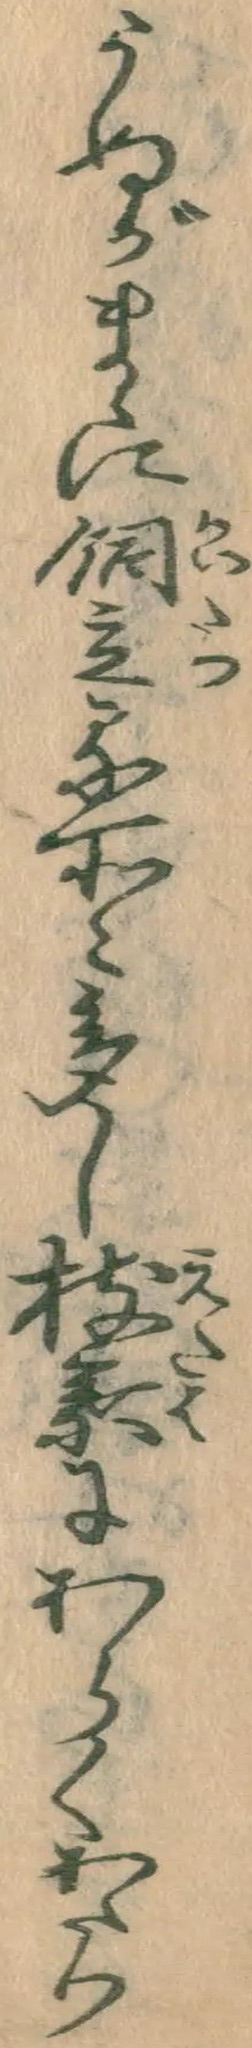うぬがまゝに飼立る所々多し枝葉にあらくあたり
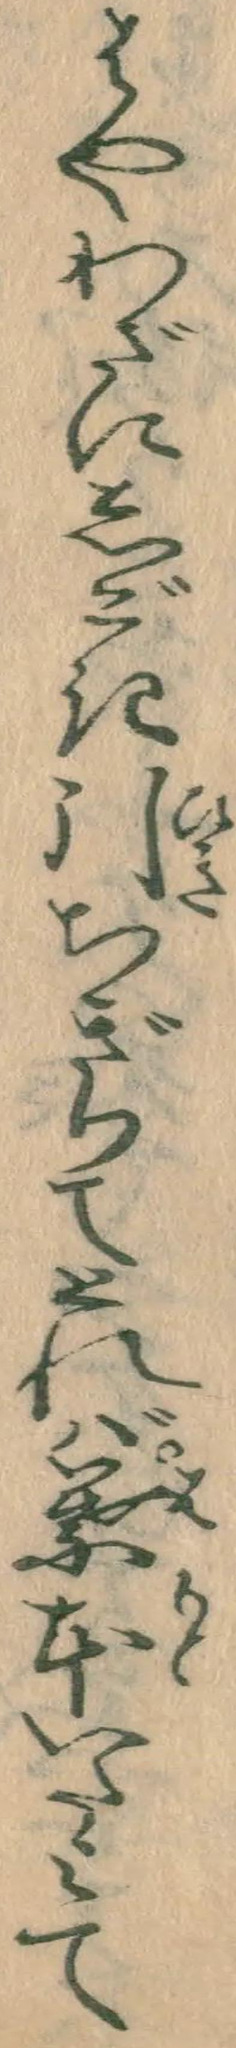はやわざにしどき引ちぎりてとれば。葉本いたみて
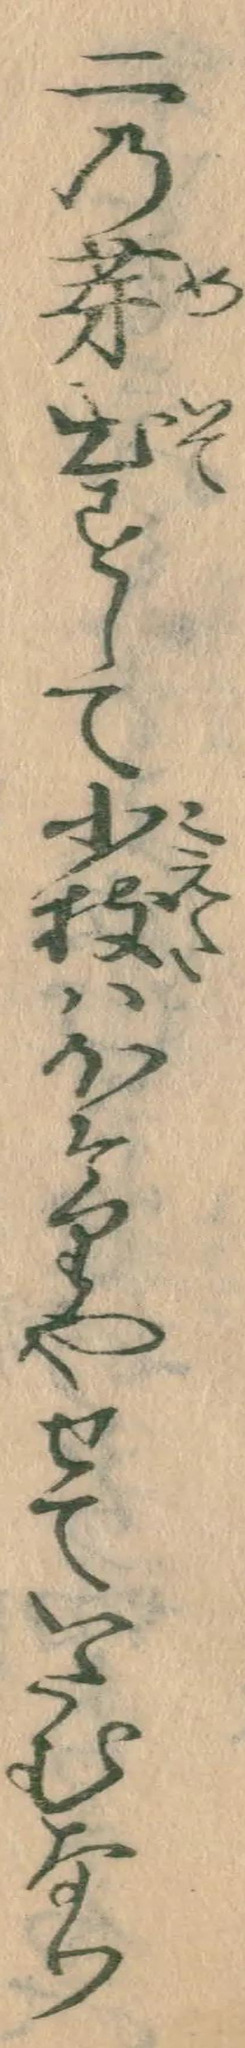二の芽出すして小枝はほそりやせていたむなり
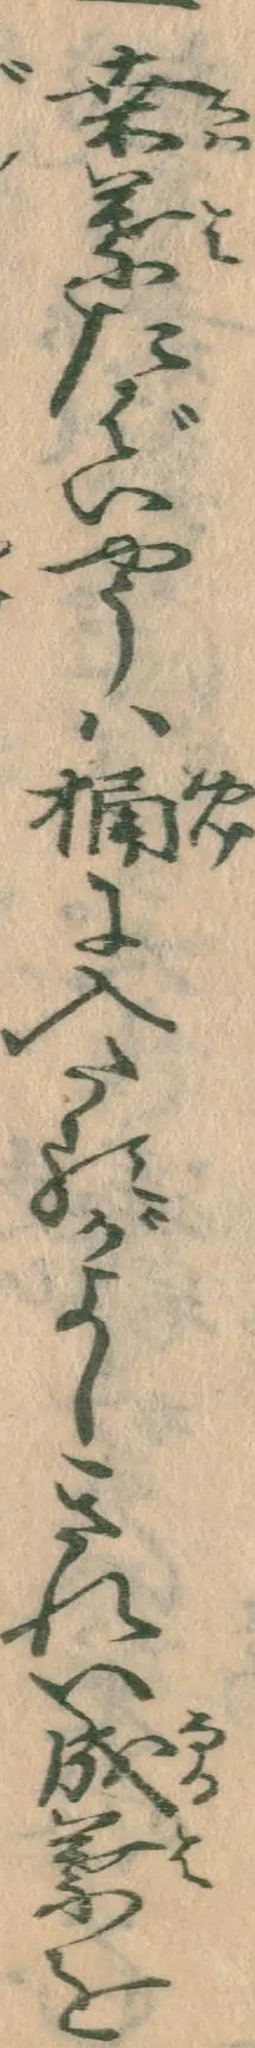一桑葉たばいやうは桶に入たるがよしきれい成葉を
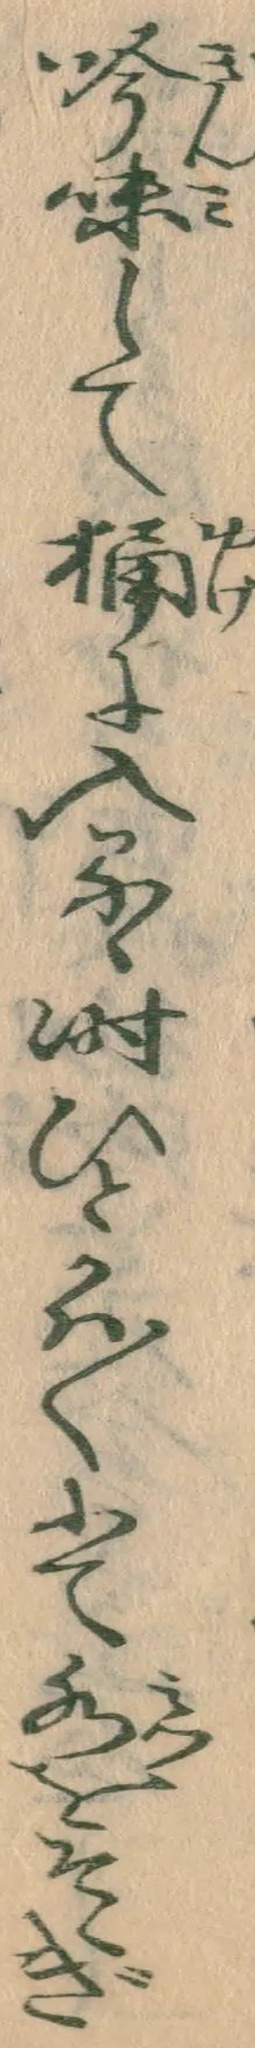吟味して桶に入るゝ時ひとかは〳〵にて水をそゝぎ
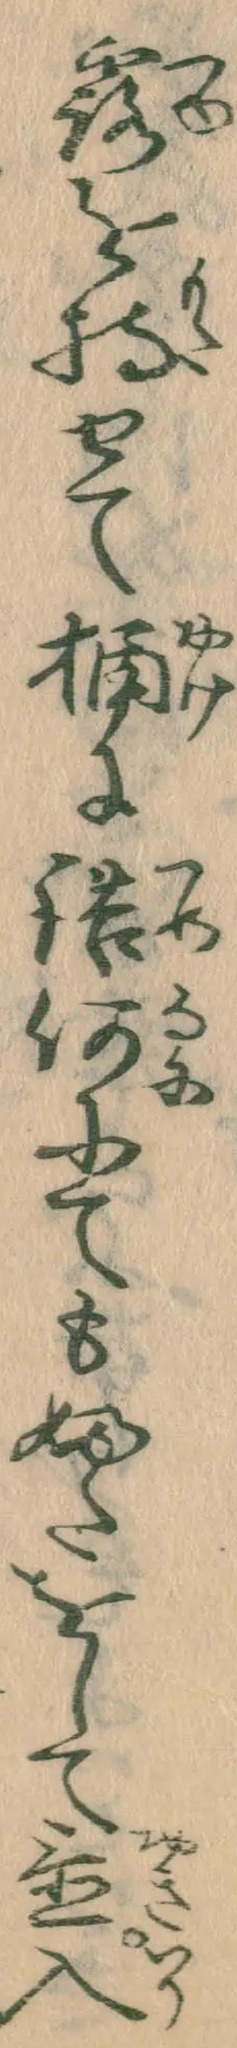露を持せて桶に詰何にてもふたをして置。入
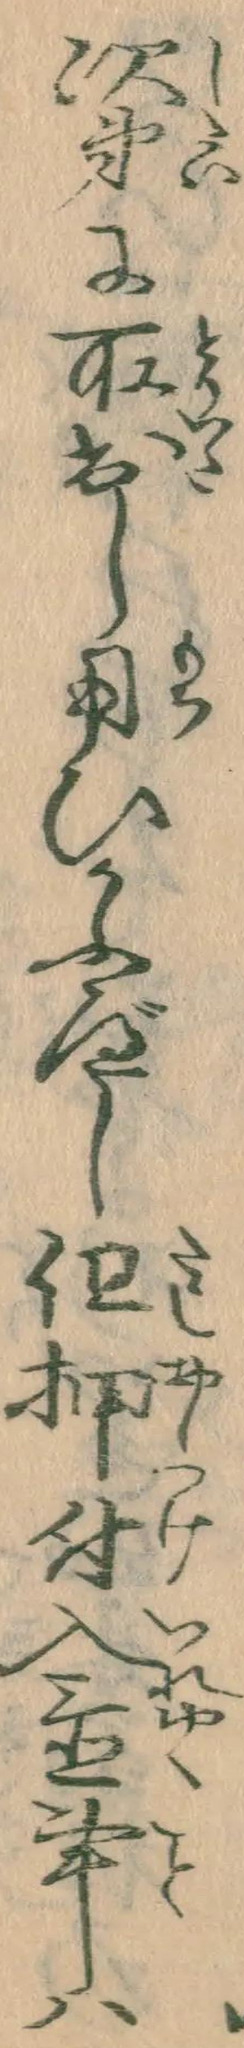次第に取出し用ひかふべし但押付入置事は
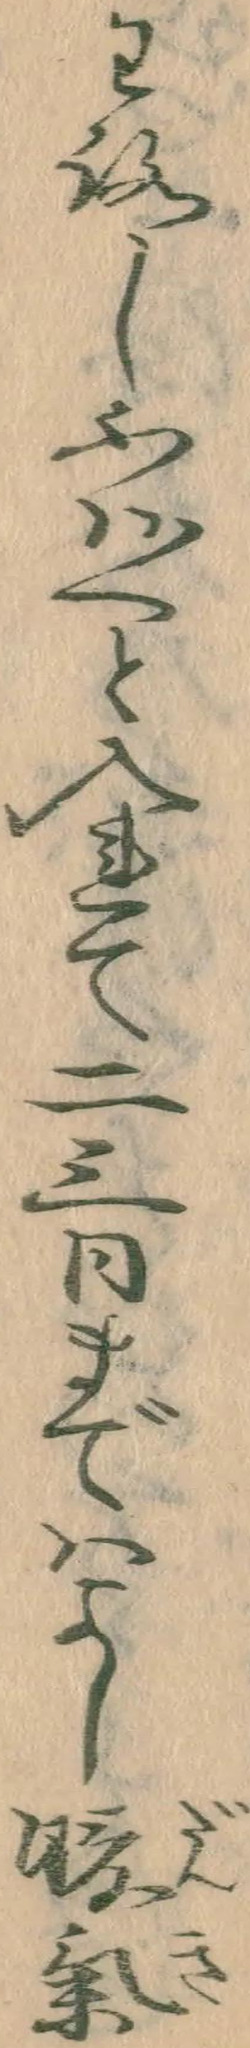わろしふは〳〵と入れて二三日まではよし暖気
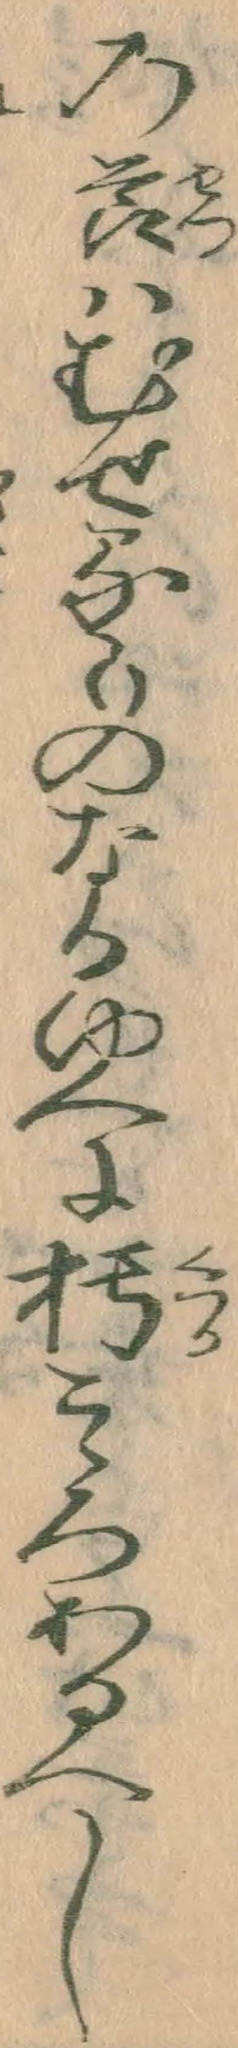の節はむせるものなるゆへに朽こゝろあるへし
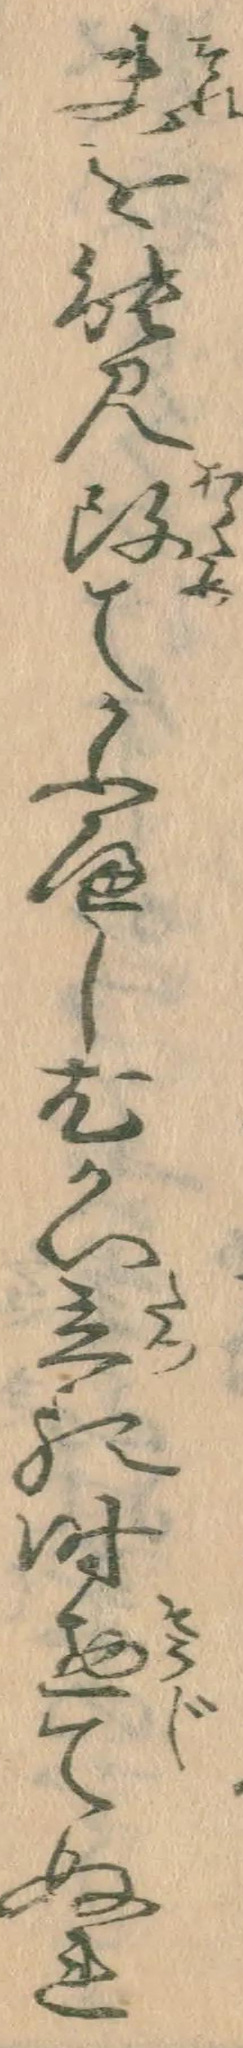夫を能見改てかふへし尤かい立る時惣てぬれ
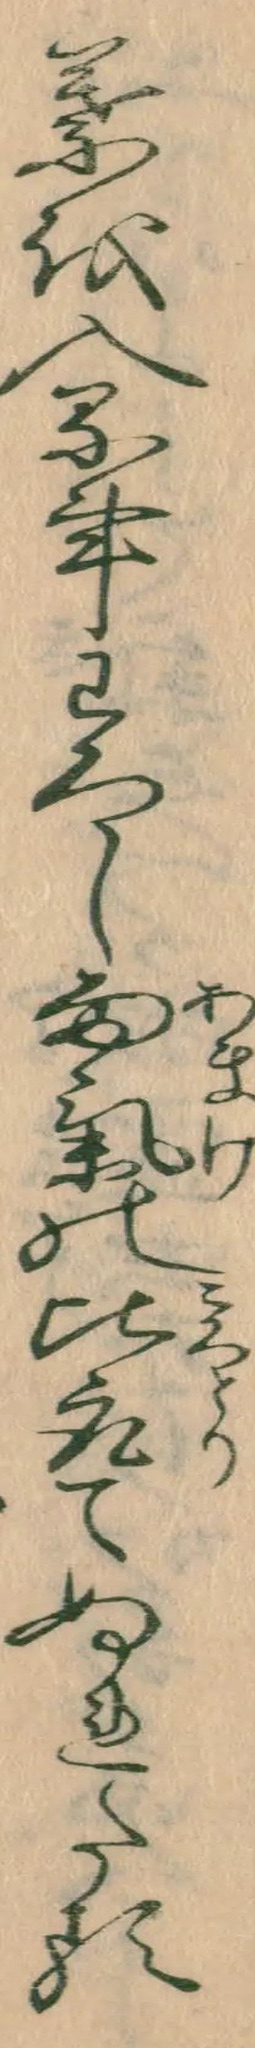葉を入る事わろし雨気の比取てぬれたる
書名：蚕飼養法記
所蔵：国立国会図書館 National Diet Library, JAPAN
